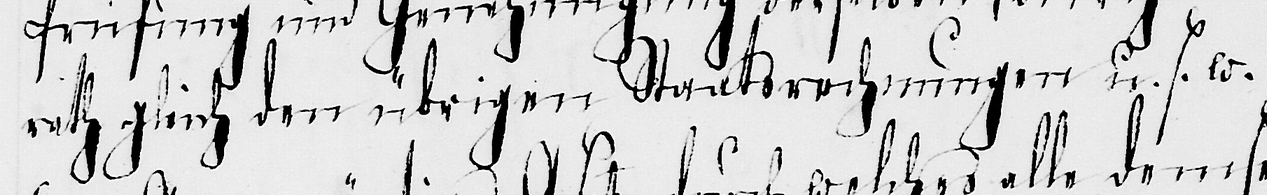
rath gleich den übrigen Staatsrechnungen u. s. w.
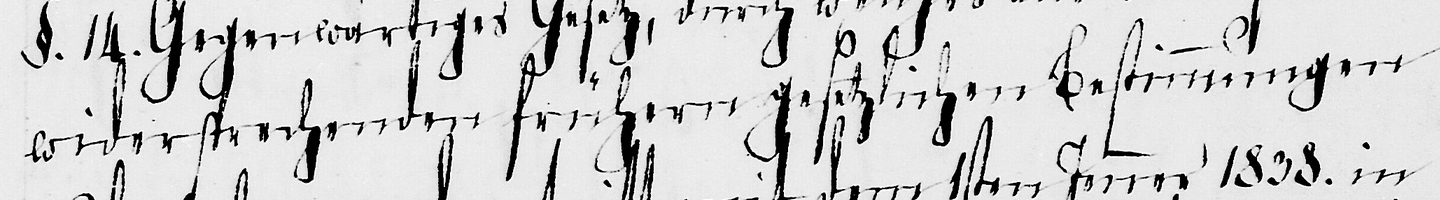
widersprechenden frühern gesetzlichen Bestimmungen
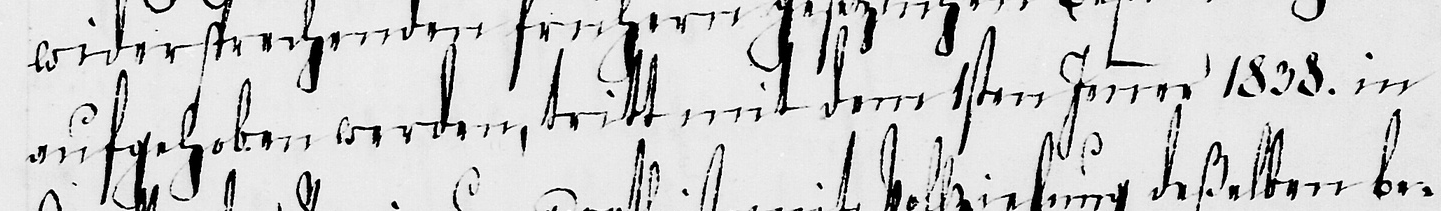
aufgehoben werden, tritt mit dem 1sten Jenner 1838. in
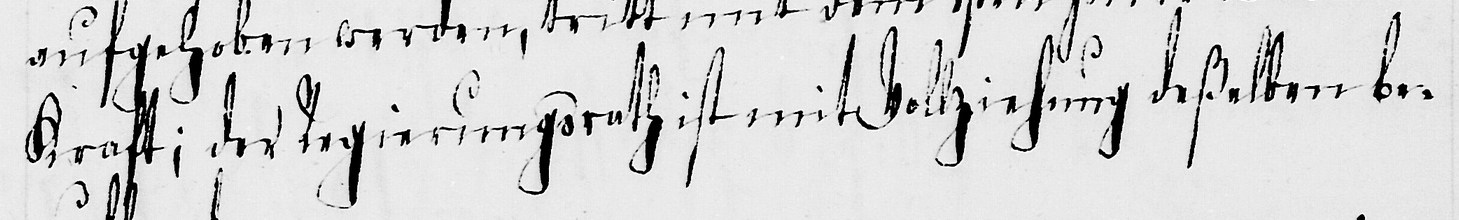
Kraft; der Regierungsrath ist mit Vollziehung deßelben be¬
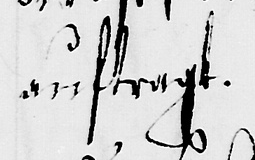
auftragt.
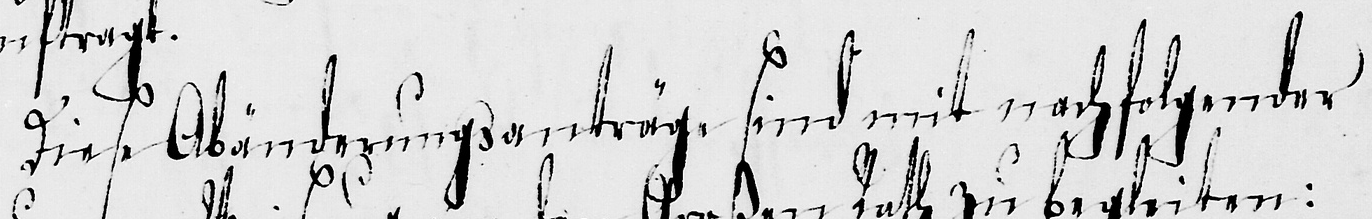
Diese Abänderungsanträge sind mit nachfolgender
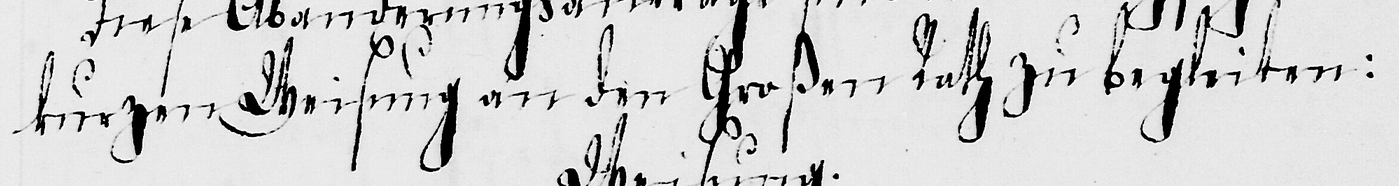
kurzen Weisung an den Großen Rath zu begleiten:
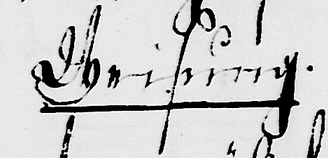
Weisung.
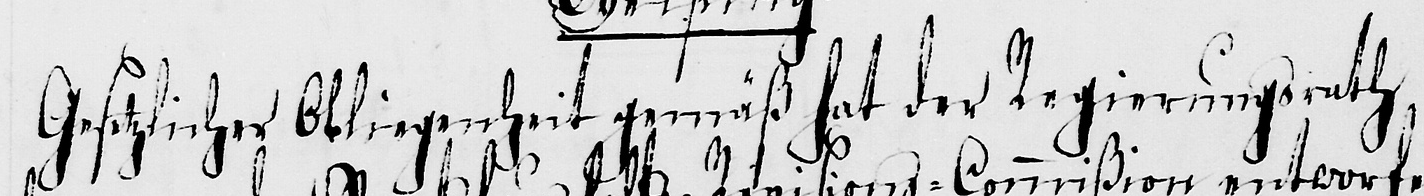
Gesetzlicher Obliegenheit gemäß hat der Regierungsrath
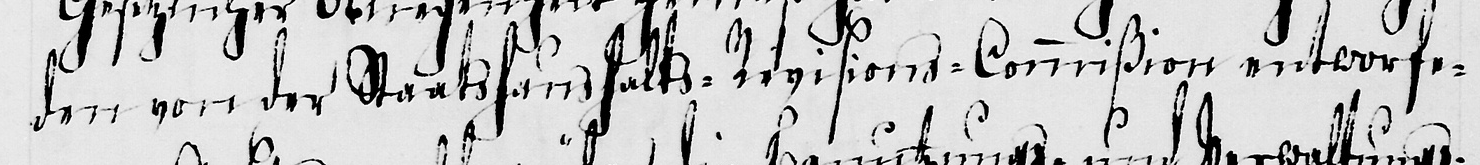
den von der Staatshaushalts-Revisions-Commißion entworfe¬
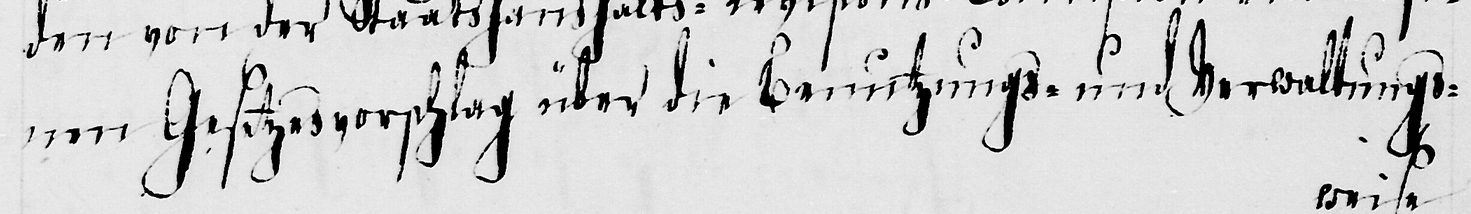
nen Gesetzesvorschlag über die Benutzungs- und Verwaltungs-
